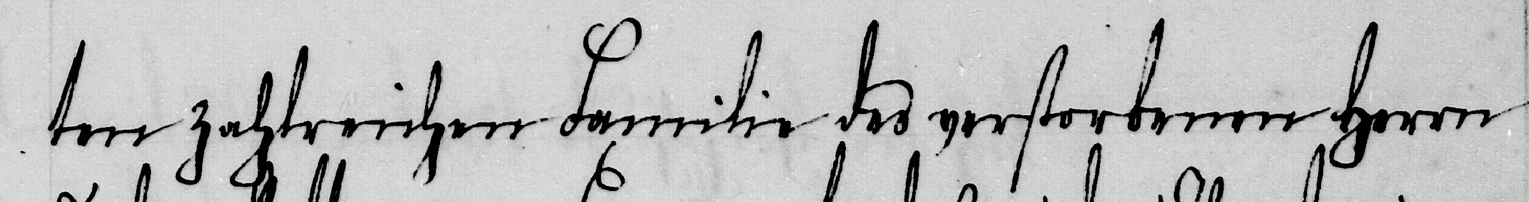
ten zahlreichen Familie des verstorbenen Herrn
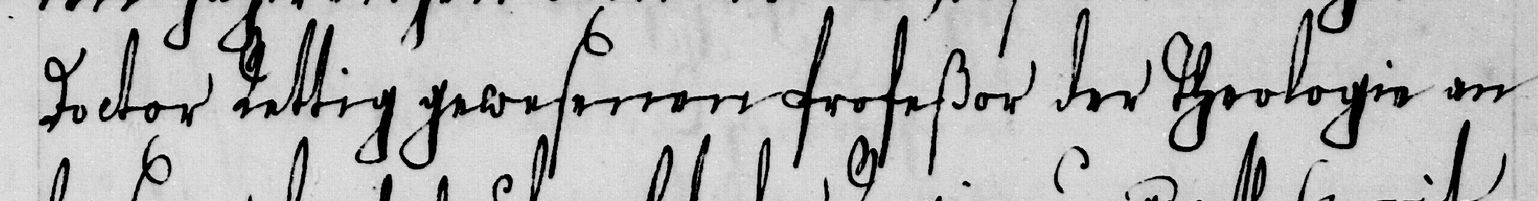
Doctor Rettig gewesenen Profeßor der Theologie an
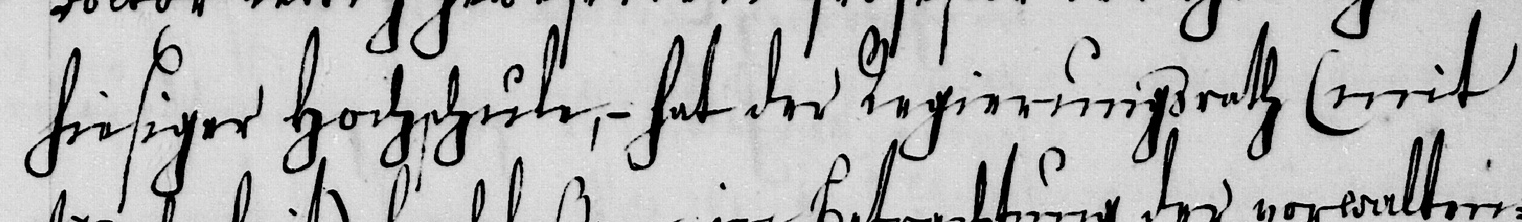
hiesiger Hochschule, – hat der Regierungsrath (mit
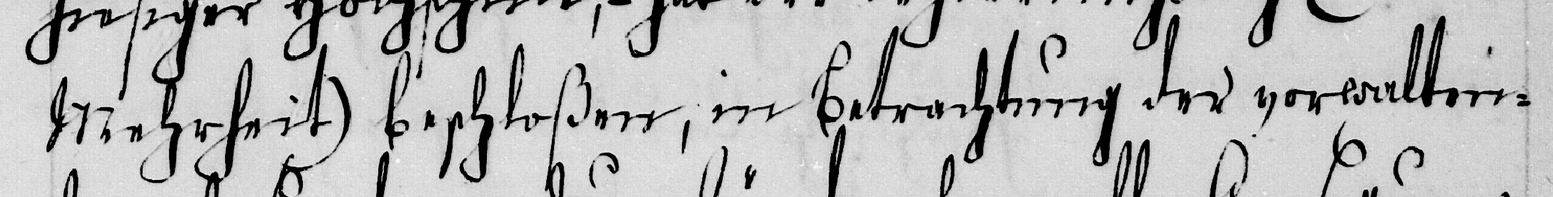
Mehrheit) beschloßen, in Betrachtung der vorwalten¬
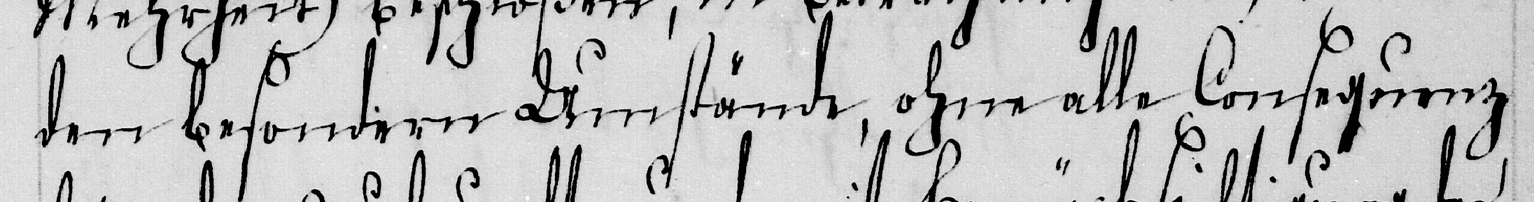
den besondern Umstände, ohne alle Consquenz
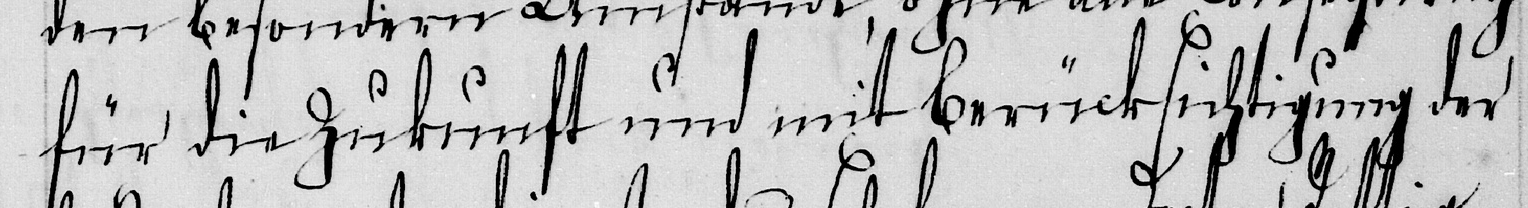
für die Zukunft und mit Berücksichtigung der
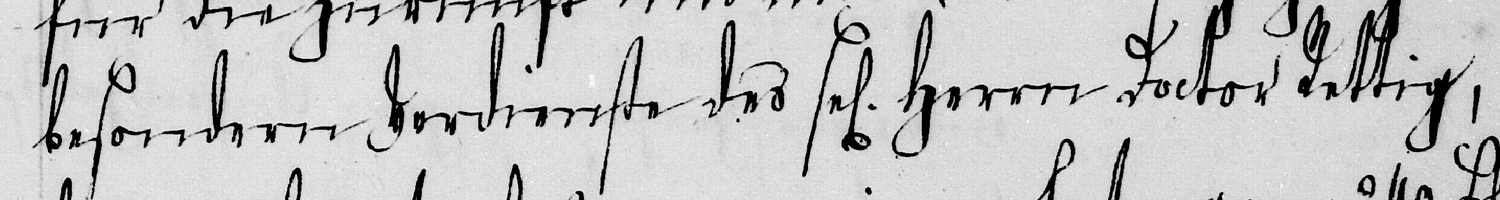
besondern Verdienste des sel. Herrn Doctor Rettig,
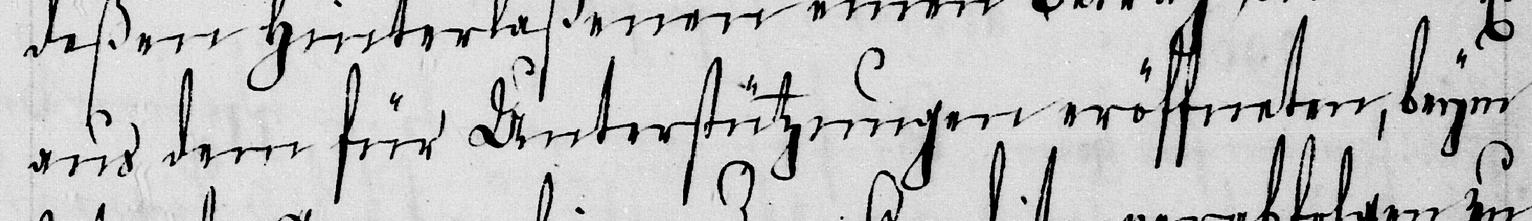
aus dem für Unterstützungen eröffneten, beym
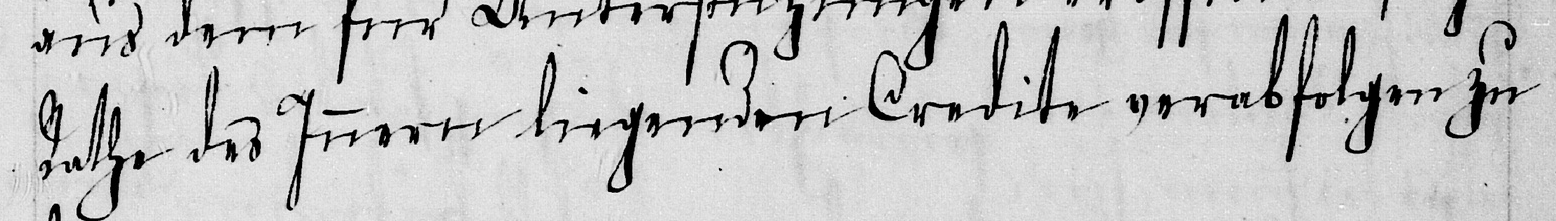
Rathe des Innern liegenden Credite verabfolgen zu
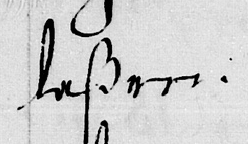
laßen.
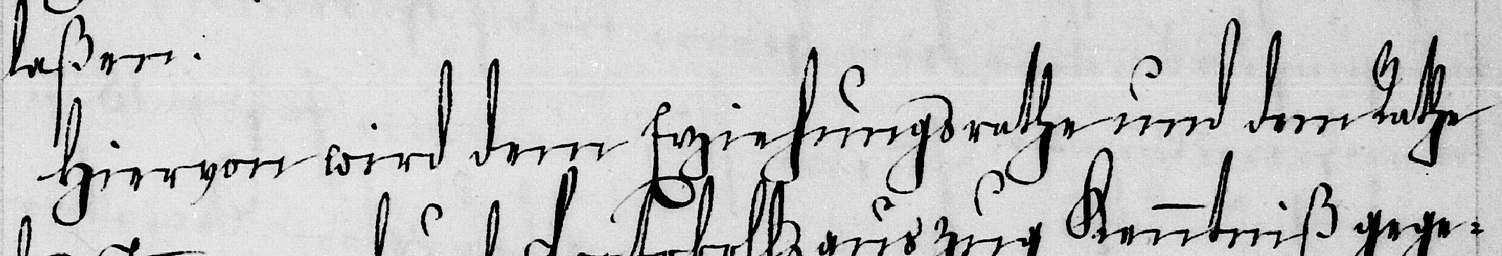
Hiervon wird dem Erziehungsrathe und dem Rathe
